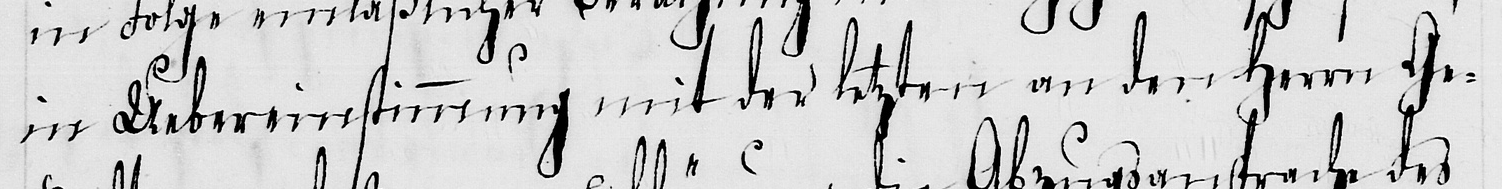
in Uebereinstimmung mit der letzten an den Herrn Ge¬
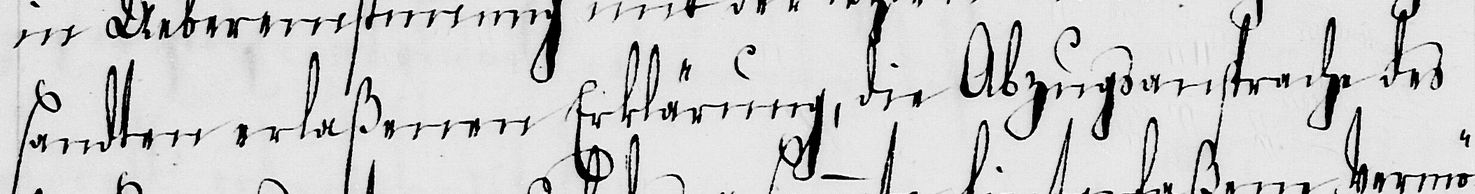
sandten erlaßenen Erklärung, die Abzugsansprache des
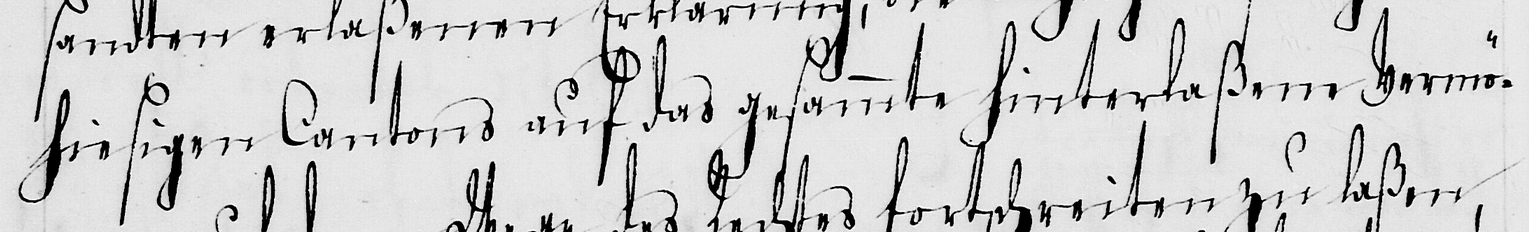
hiesigen Cantons auf das gesammte hinterlaßene Vermö¬
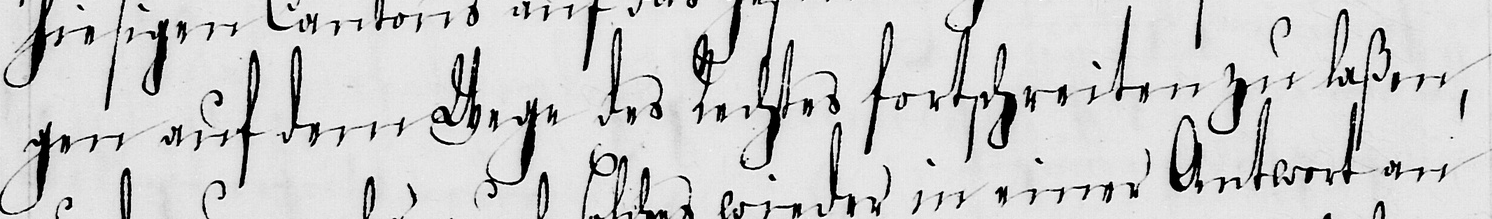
gen auf dem Wege des Rathes fortschreiten zu laßen,
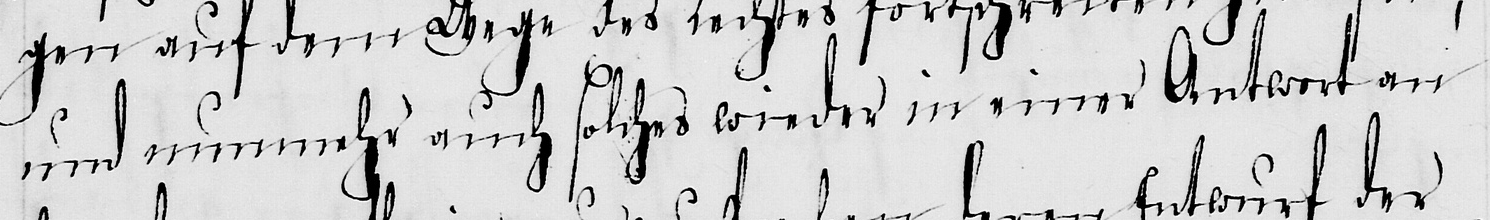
und nunmehr auch solches wieder in einer Antwort an
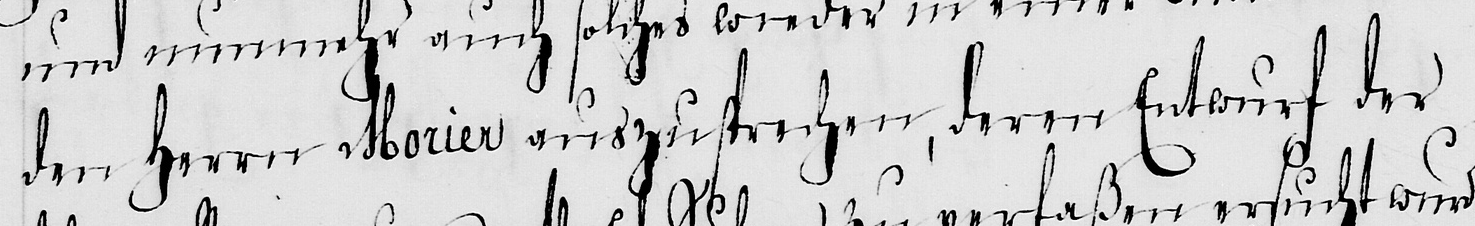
den Herrn Morier auszusprechen, deren Entwurf der
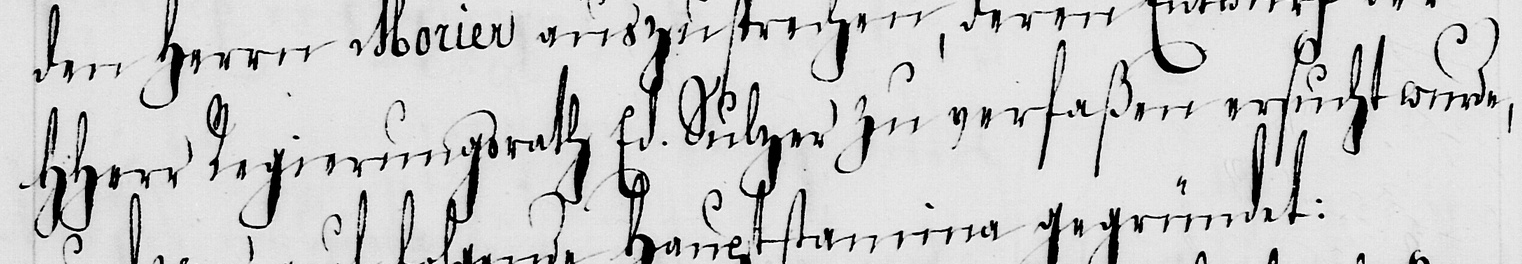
HHerr Regierungsrath Ed. Sulzer zu verfaßen ersucht wurde,
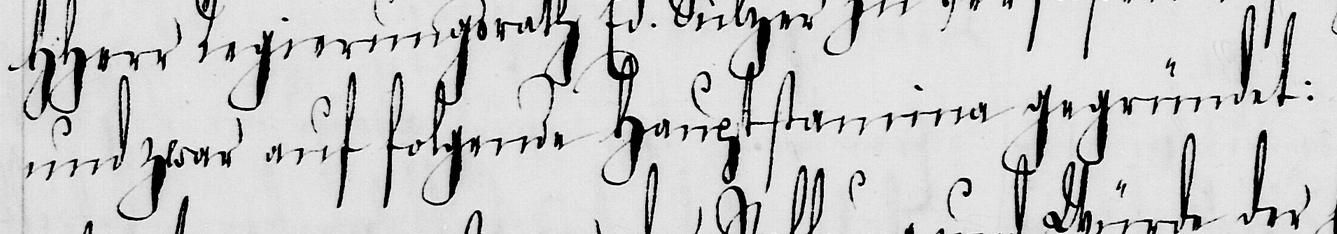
und zwar auf folgende Hauptstamina gegründet:
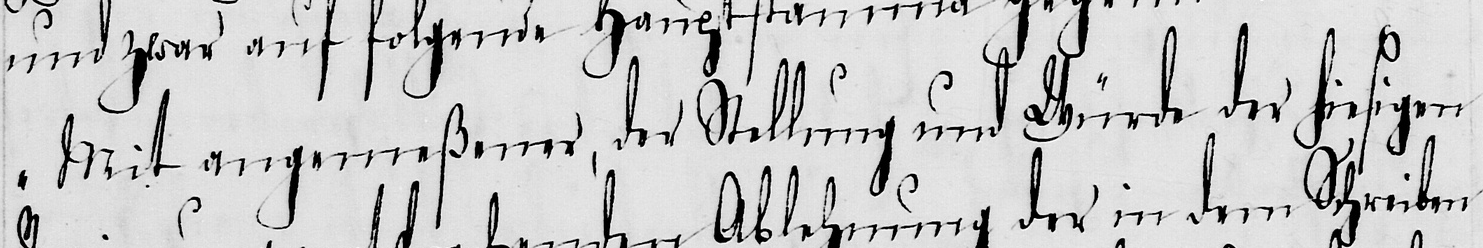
„Mit angemeßener, der Stellung und Würde der hiesigen
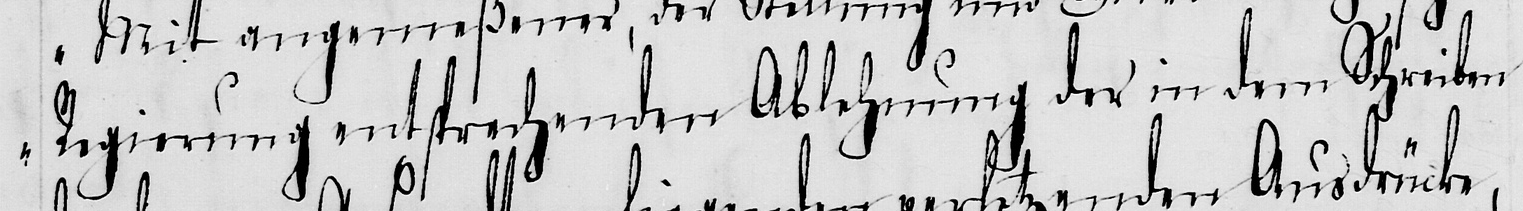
Regierung entsprochenen Ablehnung der in dem Schreiben
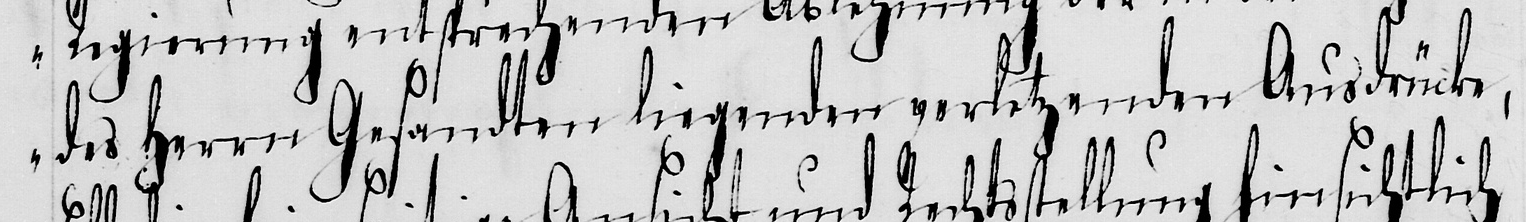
des Herrn Gesandten liegenden verletzenden Ausdrücke,
